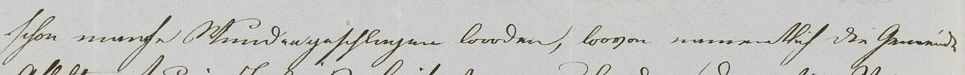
schon manche Wunden geschlagen worden, wovon namentlich die Gemeinde
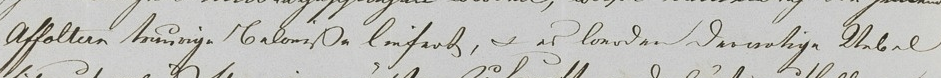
Affoltern traurige Beweiße liefert, u es werden derartige Uebel
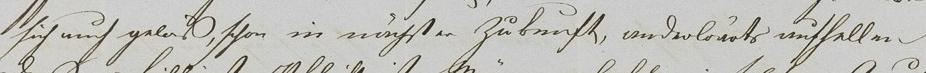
sich auch gewiß, schon in nächster Zukunft, anderwärts aufhellen
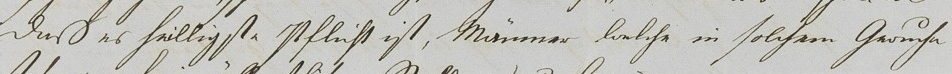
daß es heilligste Pflicht ist, Männer welche in solchem Geruche
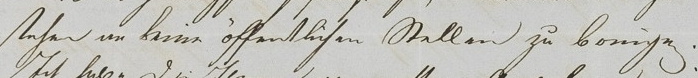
stehen an keine öffentliche Stellen zu bringen.
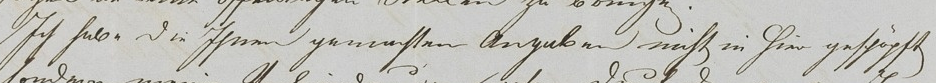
Ich habe die Ihnen gemachten Angaben nicht in hier geschöpft
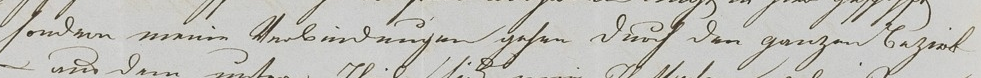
sondern meine Verbindungen gehen durch den ganzen Bezirk
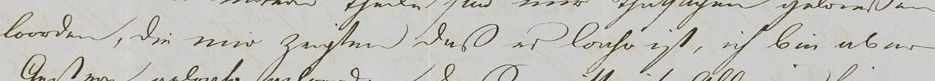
worden, die mir zeigten daß es wahr ist, ich bin aber
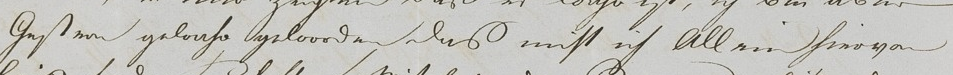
Gestern gewahr geworden daß nicht ich allein hiervon
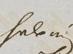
haben.
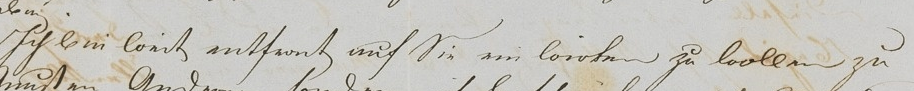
Ich bin weit entfernt auf Sie ein wirken zu wollen zu
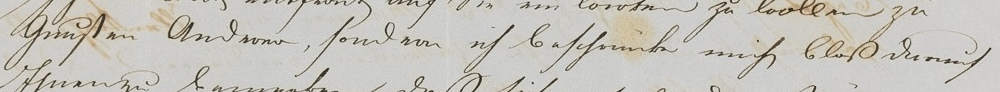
Gunsten Anderer, sondern ich beschränke mich bloß darauf
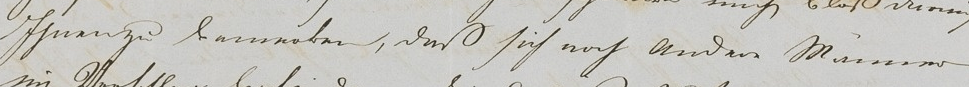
Ihnen zu bemerken, daß sich noch andere Männer
